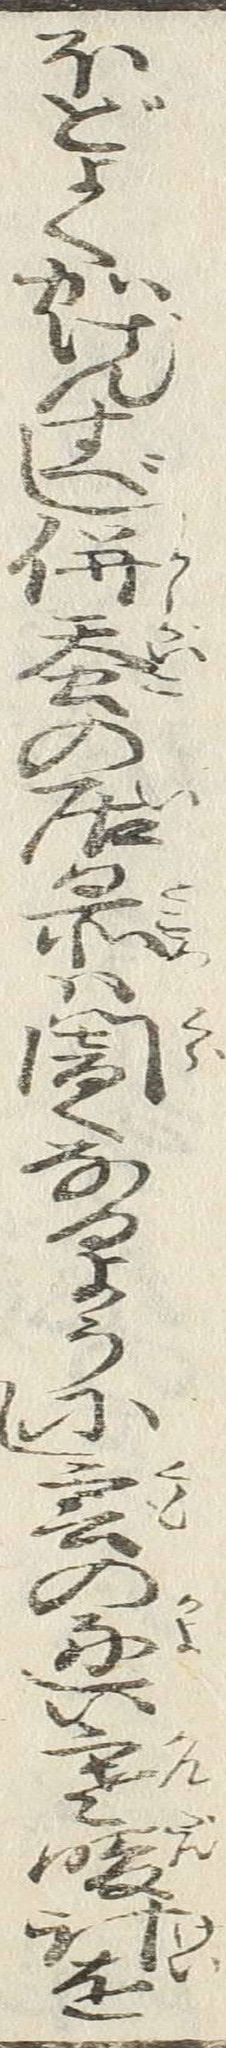ほどよくかげんすべし併蚕の居る所は闇くなるようにし雲の通い寒暖計を
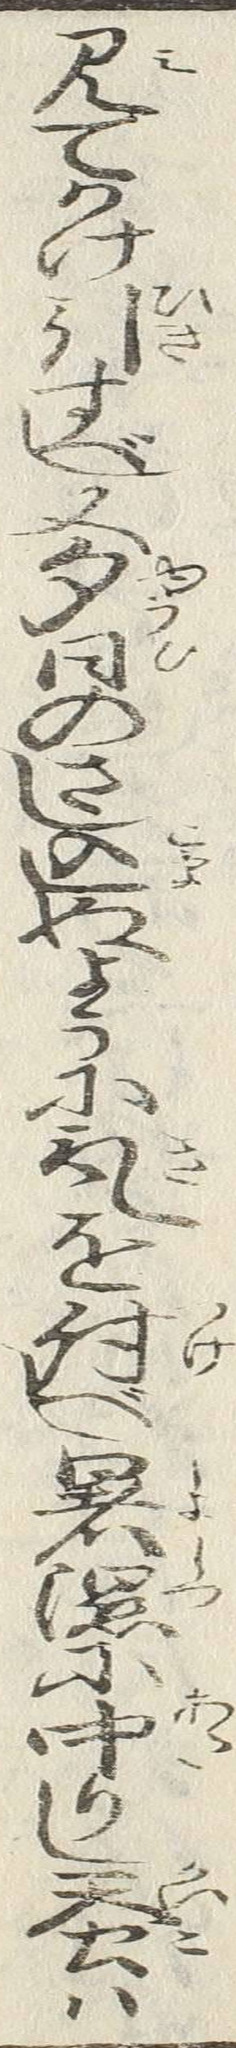見てかけ引すべし又夕日のさし込ぬように気を付べし暑湿に中りし蚕は
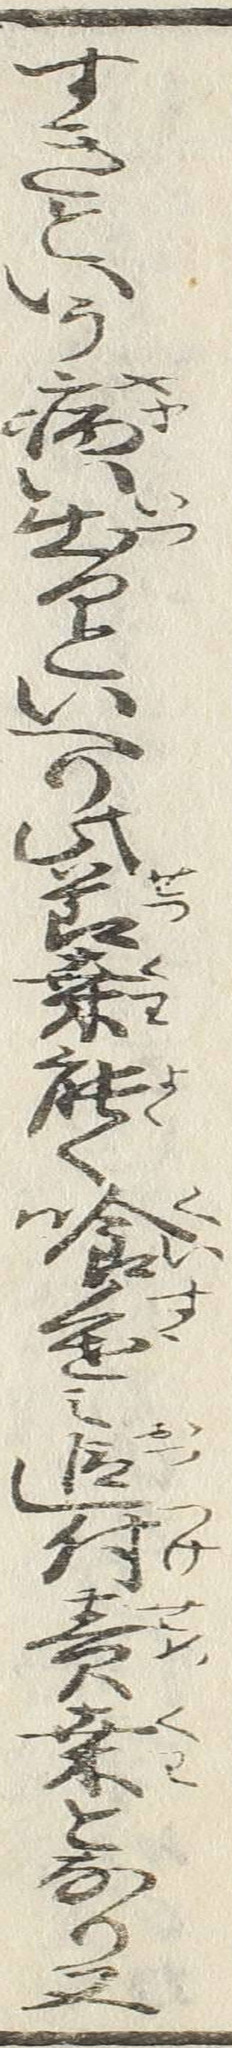すきという病い出るといへり此節桑能く喰進み追付責桑となり又
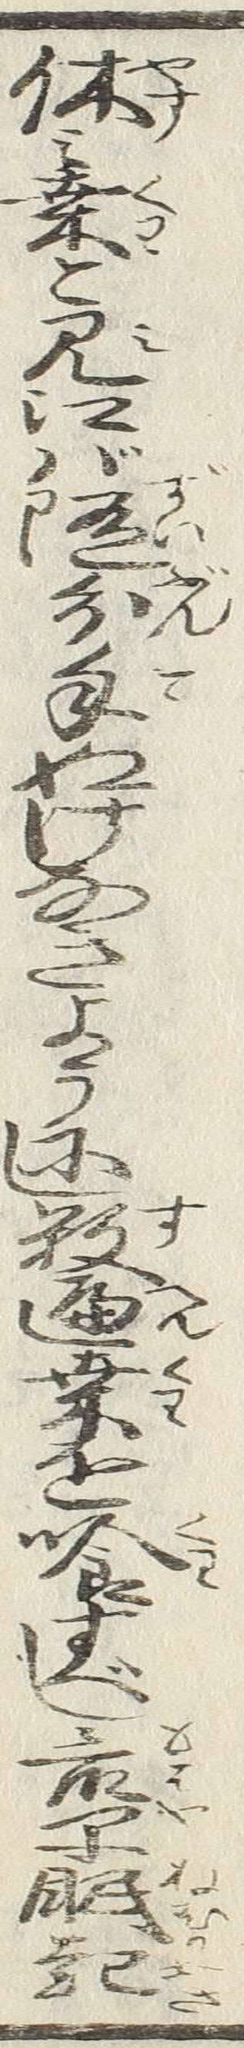休み桑と見えば随分手ぬけなきようにし数遍桑を喰すべし最早眠起
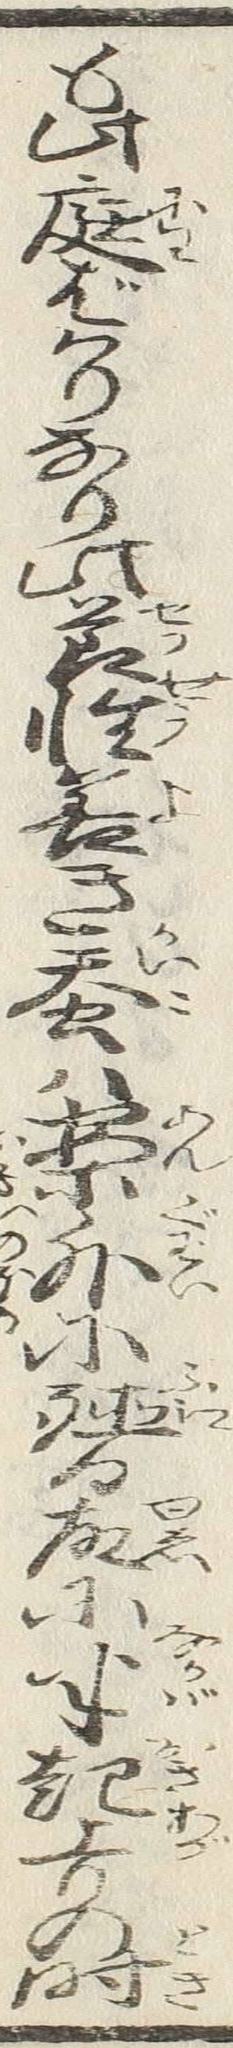も此庭ばかりなり此節性善き蚕は案外に殖る故に半起上りの時
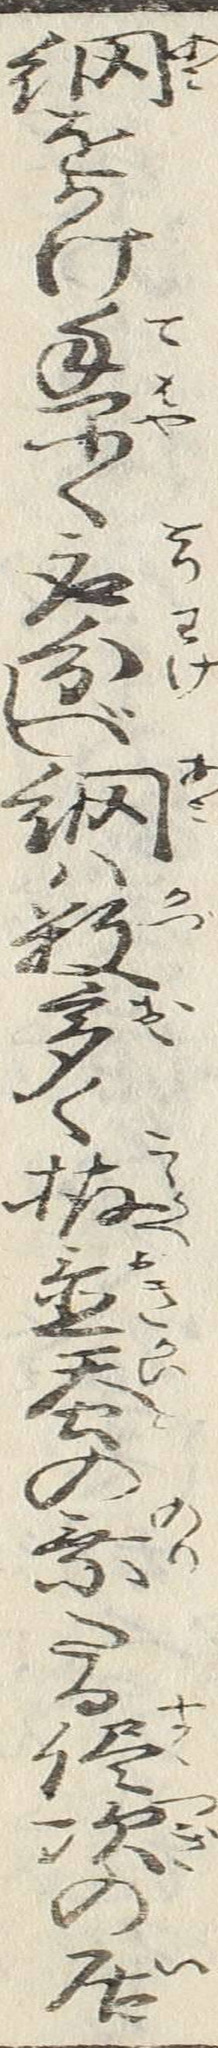網をかけ手早く取分べし網は数多く拵置蚕の乗たる侭次の居
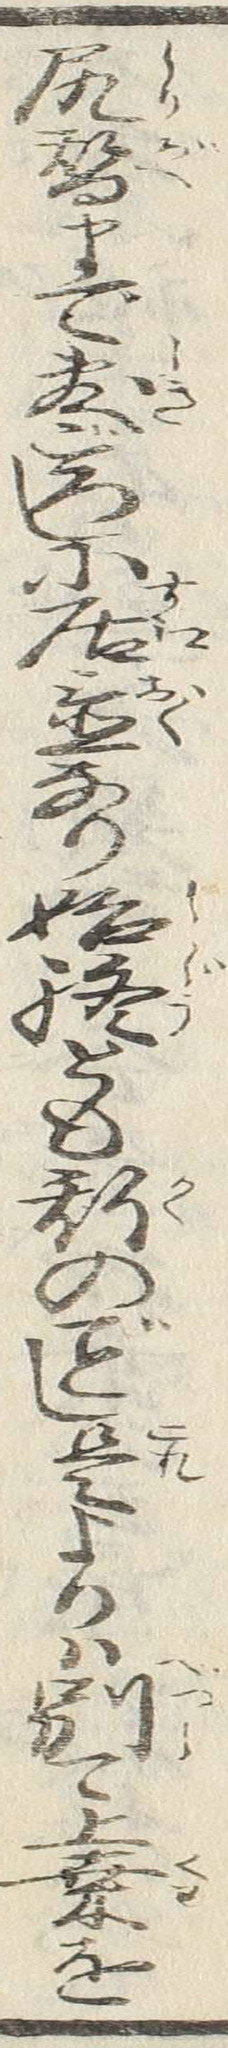尻替まで敷ごろしに居置なり始終とも斯のごとし是よりは別て上桑を
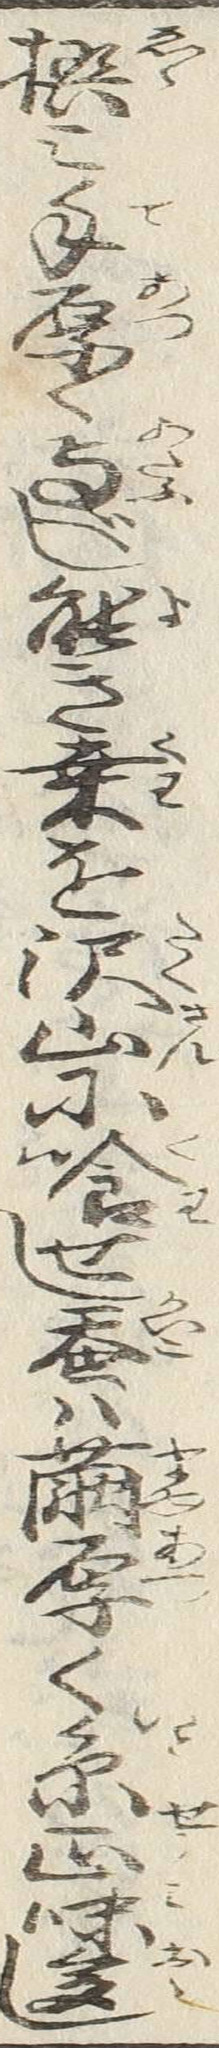撰み手厚く与べし能き桑を沢山に喰せし蚕は繭厚く糸正味多し
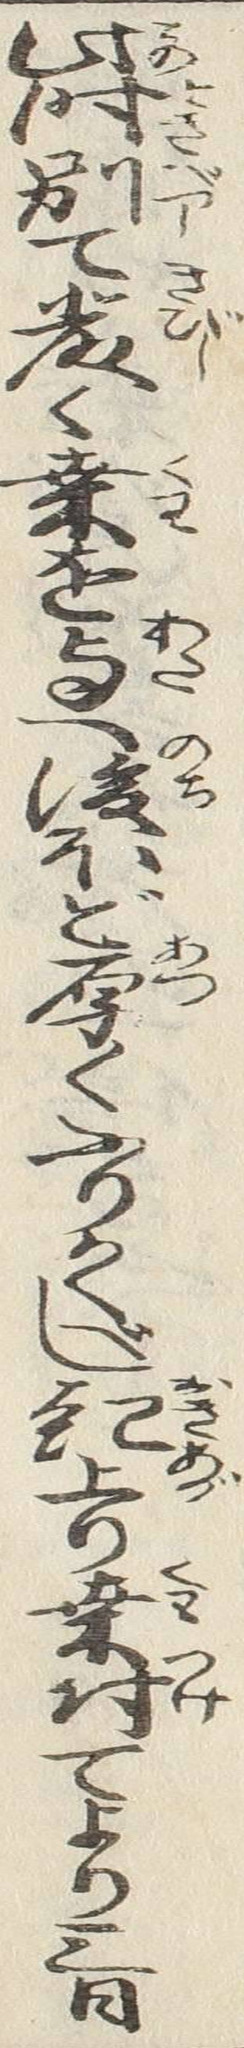此時別て厳く桑を与へ後ほど厚くふりかくべし起上り桑付てより三日

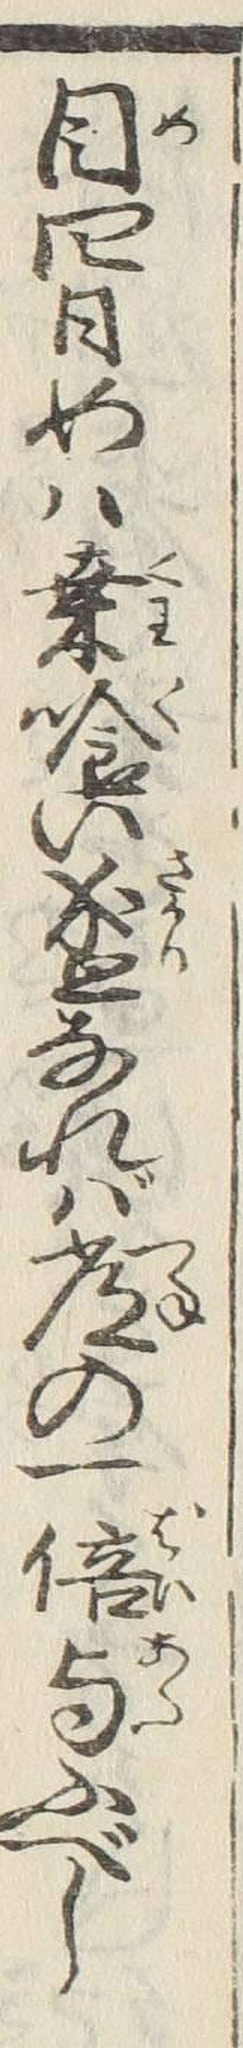目四日めは桑喰い盛なれば常の一倍与ふべし
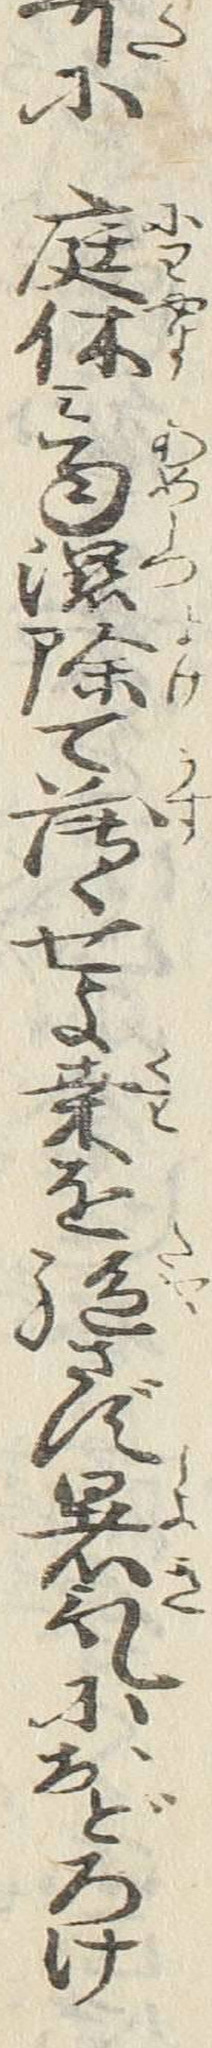哥に庭休み雨湿除て薄くせよ桑を絶さず暑気におどろけ
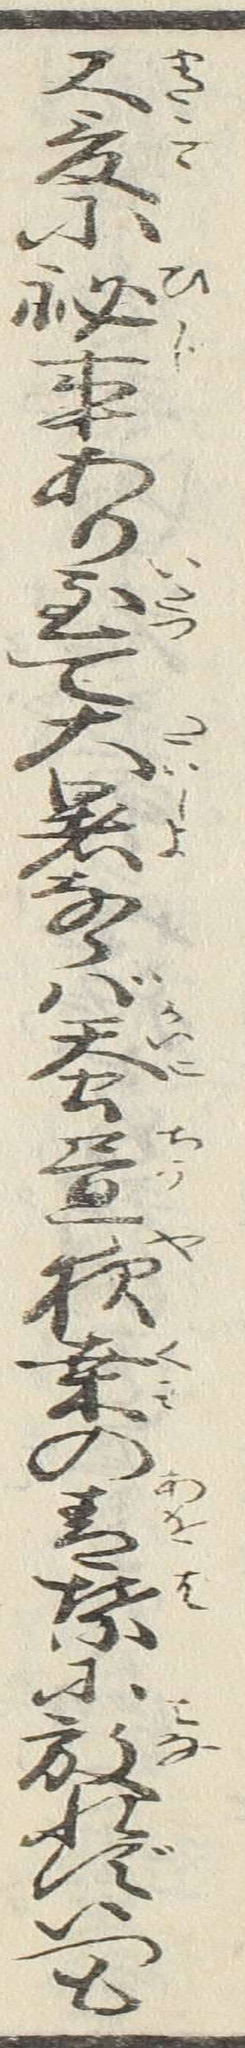又爰に秘事あり至て大暑ならば蚕昼夜桑の青葉に放れずいつも
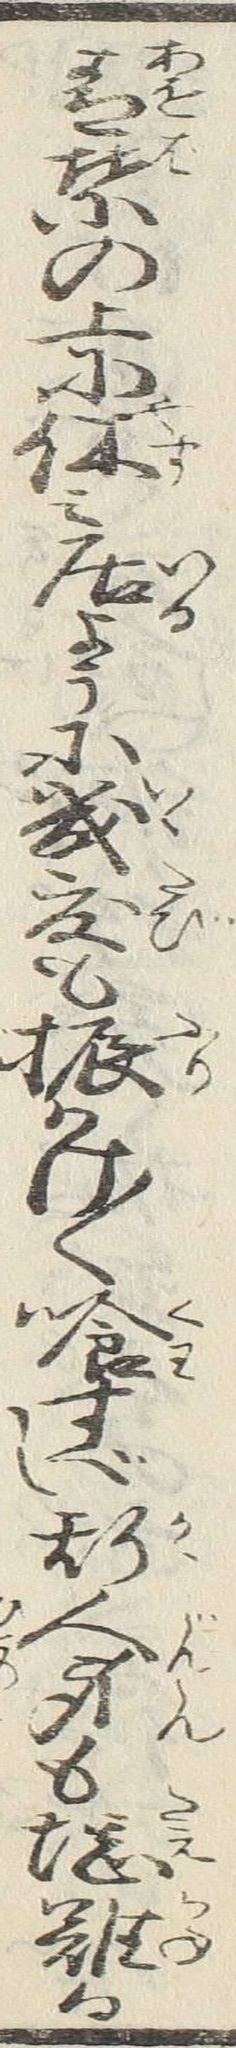青葉の上に休み居ように幾度も振かけ〳〵喰すべし斯人身も堪難る
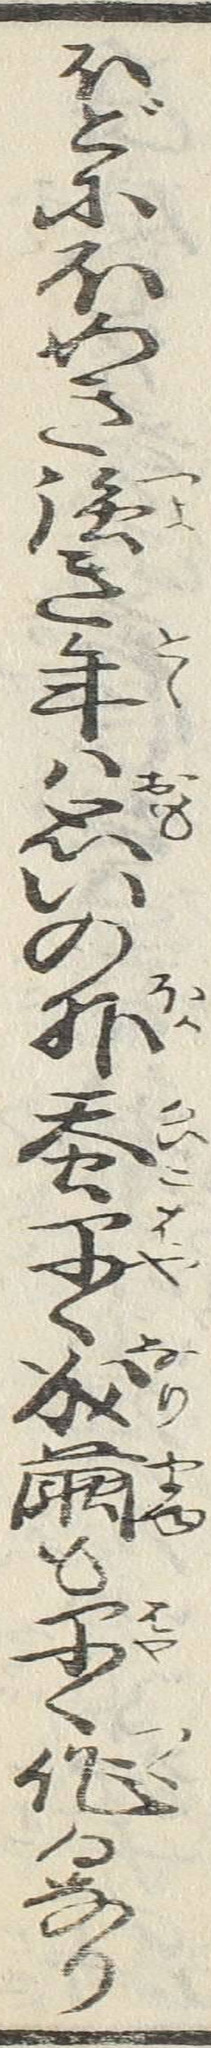ほどにほめき強き年は思いの外蚕早く成繭も早く作るなり
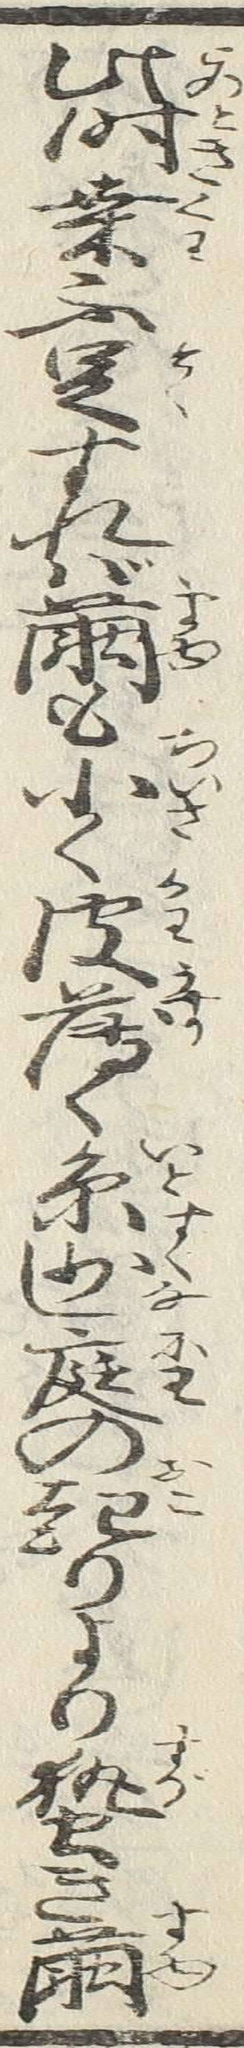此時桑ふ足すれば繭も小く皮薄く糸少し庭の起りより蟄き繭
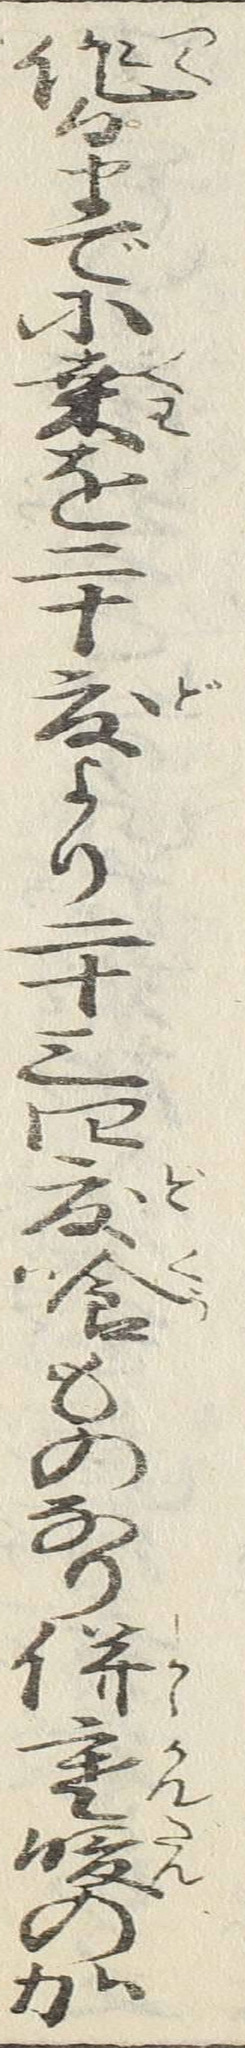作るまでに桑を二十度より二十三四度喰ものなり併寒暖の加
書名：養蠶實驗録
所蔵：東京大学農学生命科学図書館 国文学研究資料館
